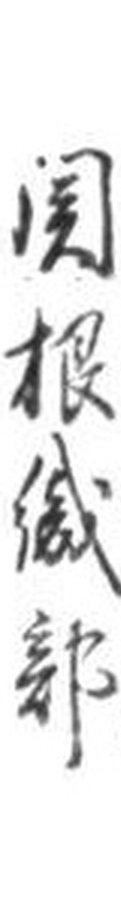関根織部
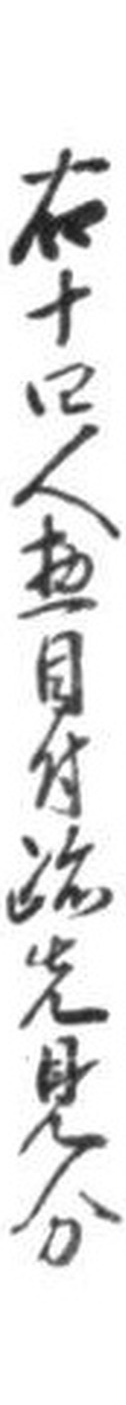右十四人惣目付跡先見分
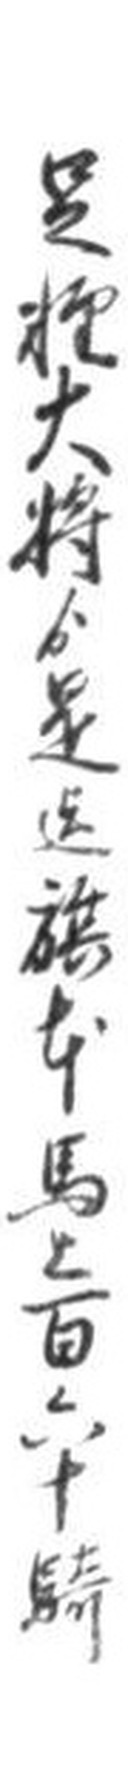足軽大将ゟ是迄旗本馬上百六十騎
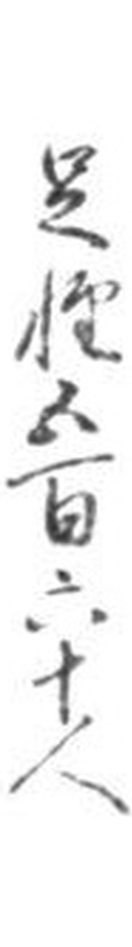足軽五百六十人
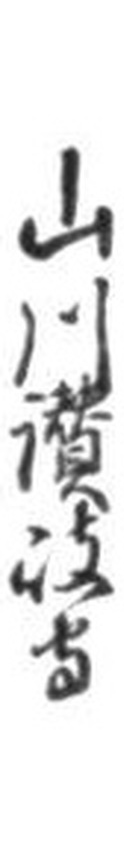山川讃岐守
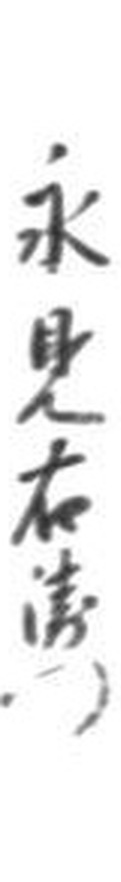永見右衛門
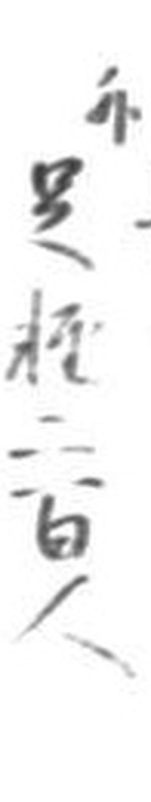外足軽二百人
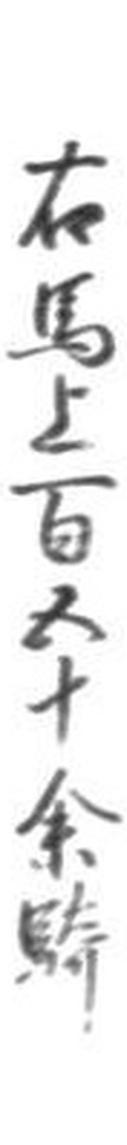右馬上百五十余騎
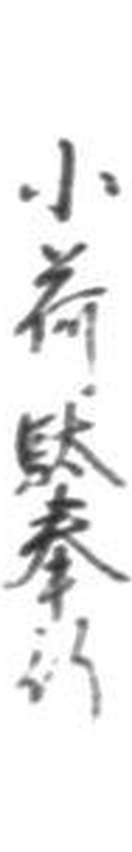小荷駄奉行
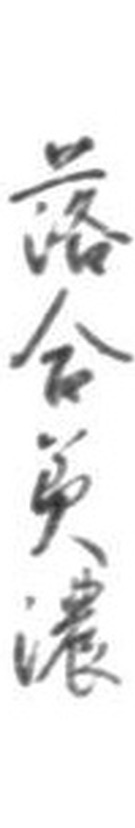落合美濃
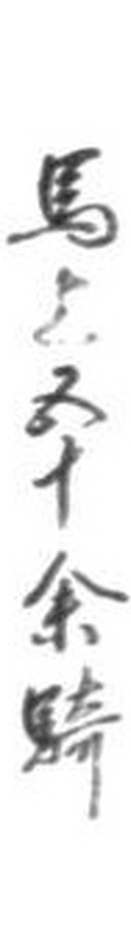馬上五十余騎
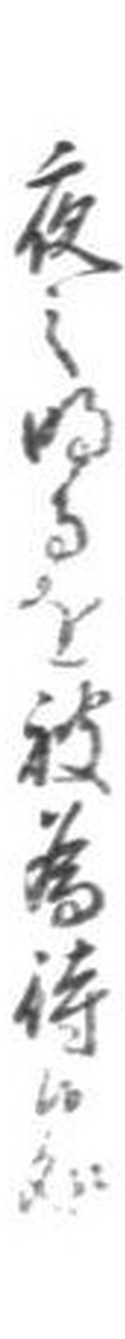夜之明るを被為待候処

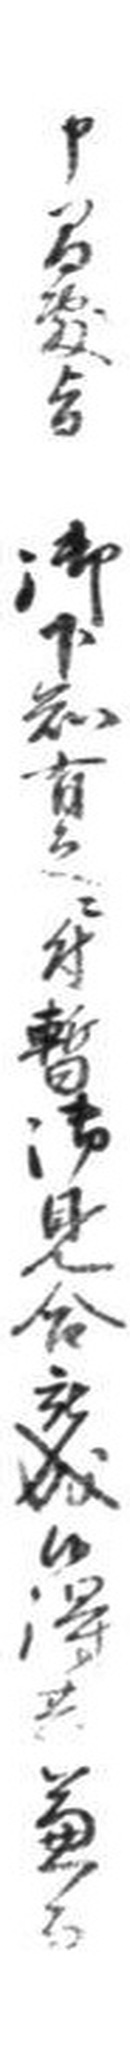申間敷旨御下知有之ニ付暫御見合被成候得共兼而
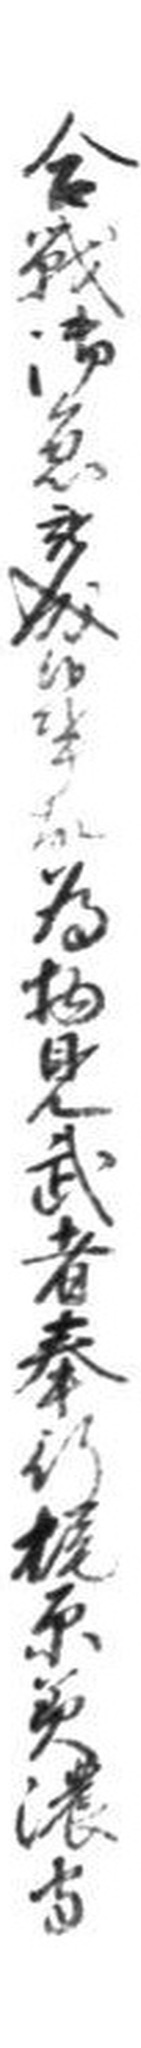合戦御急被成候故為物見武者奉行梶原美濃守
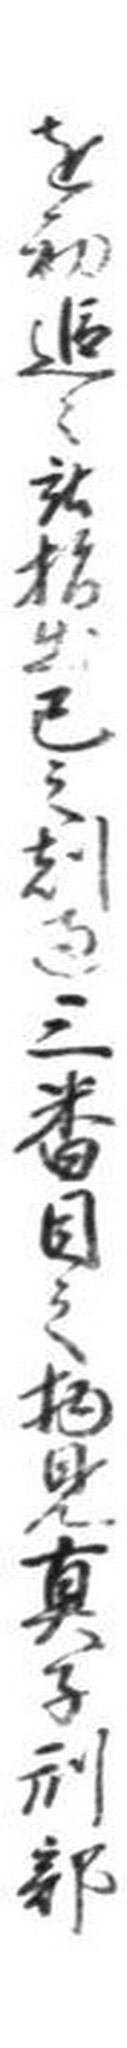を初追々被指出巳之刻過三番目之物見真子刑部
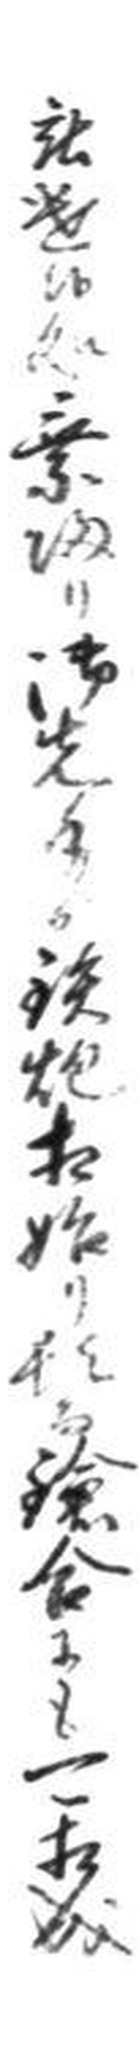被遣候処乗帰り御先手ゟ鉄炮相始り頓而鎗合にも可相成
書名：家譜 二 忠直公 従文禄四年到慶安四年
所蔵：福井県文書館 Fukui Prefectural Archives
